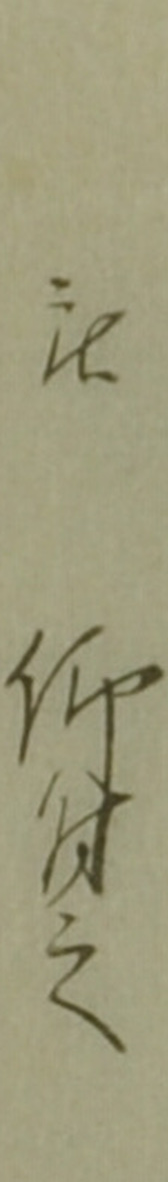被仰付之
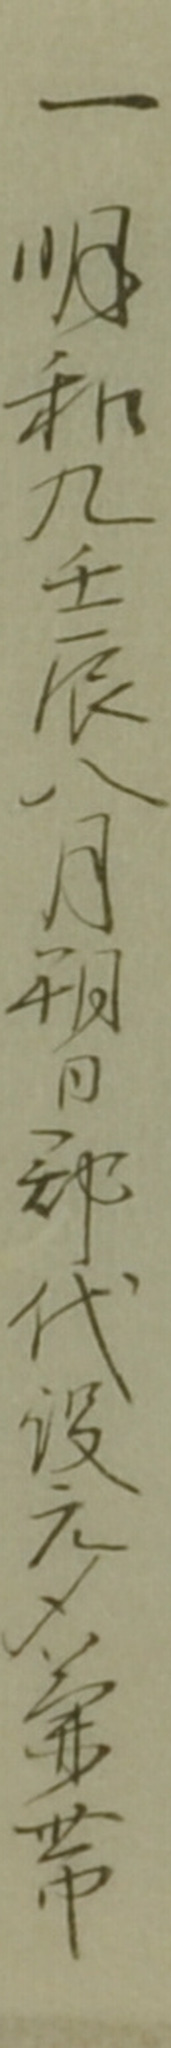一明和九壬辰八月朔日部代役元〆兼帯
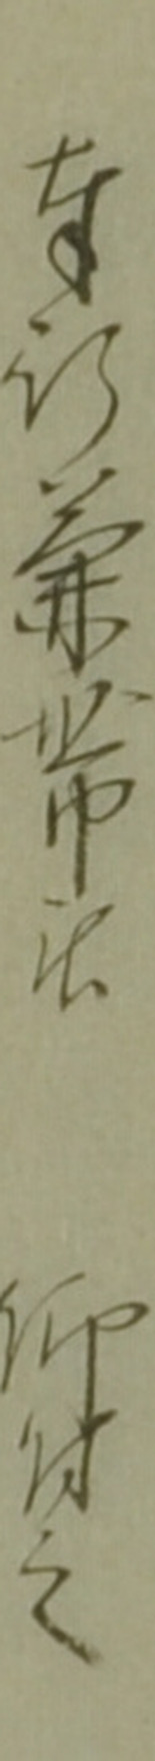奉行兼帯被仰付之
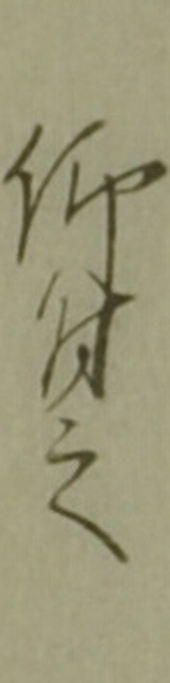仰付之
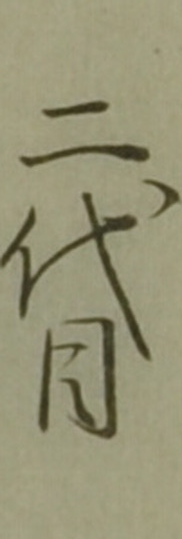二代目
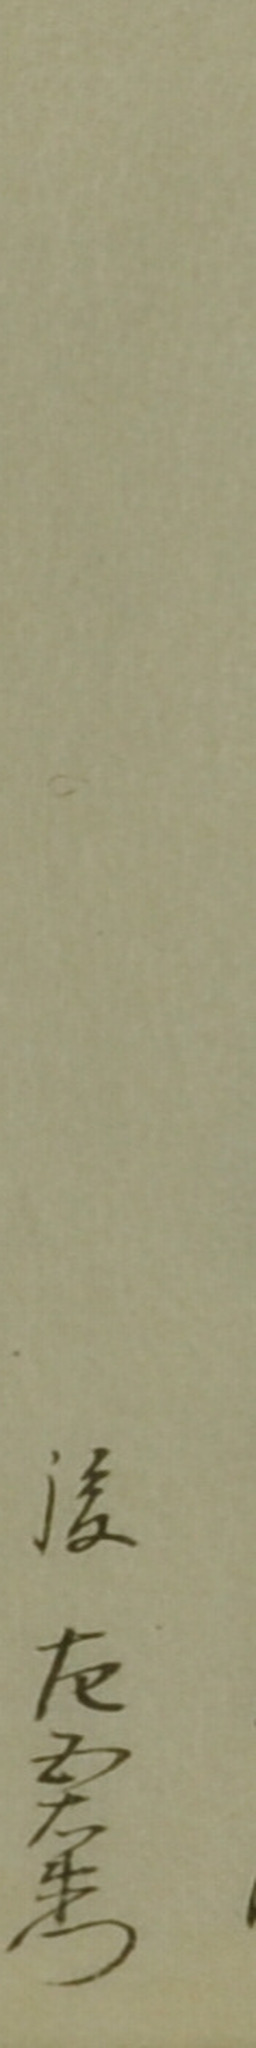後左五右衛門
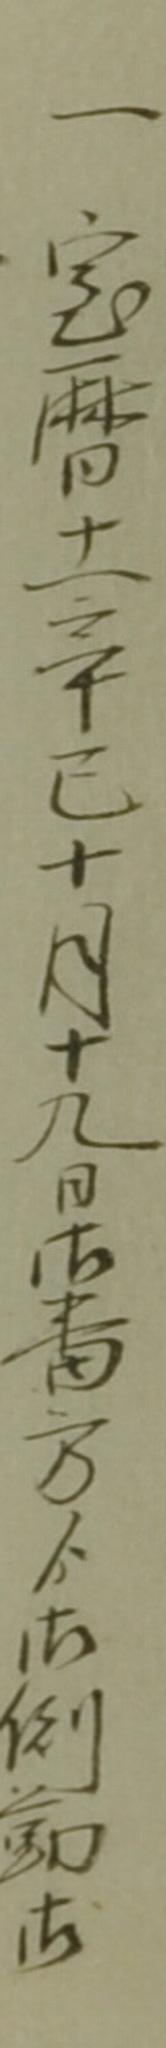一宝暦十一辛巳十月十九日御番方ゟ御側勤御
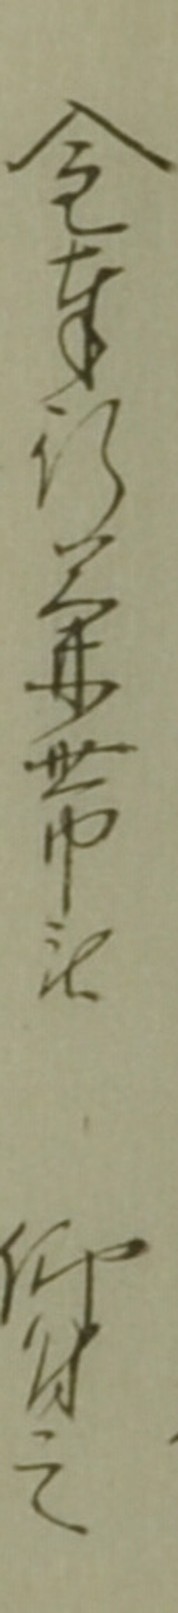金奉行兼帯被仰付之
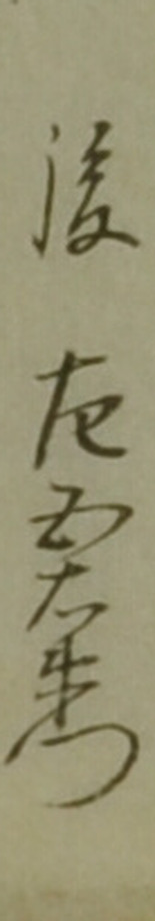後左五右衛門
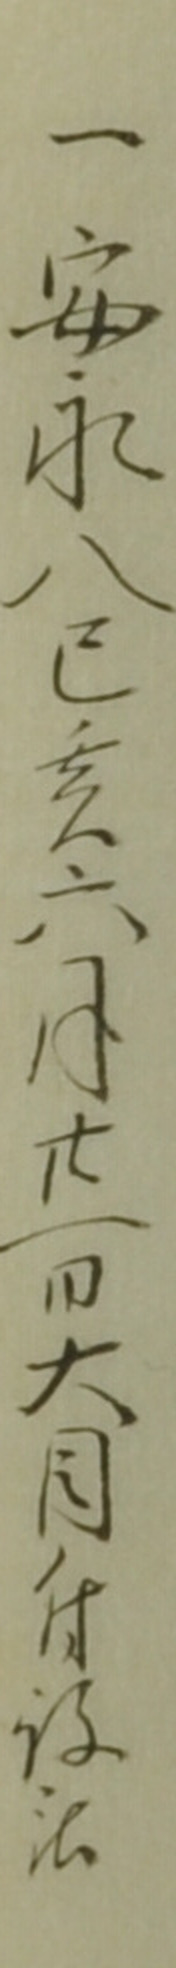一安永八己亥六月廿一日大目付役被

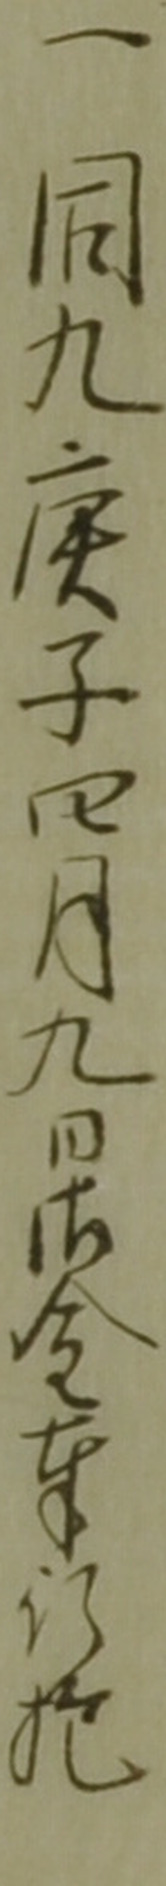一同九庚子四月九日御金奉行抱
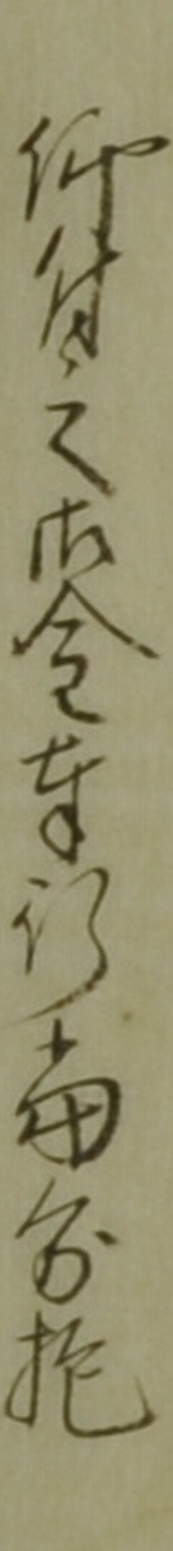仰付之御金奉行当分抱
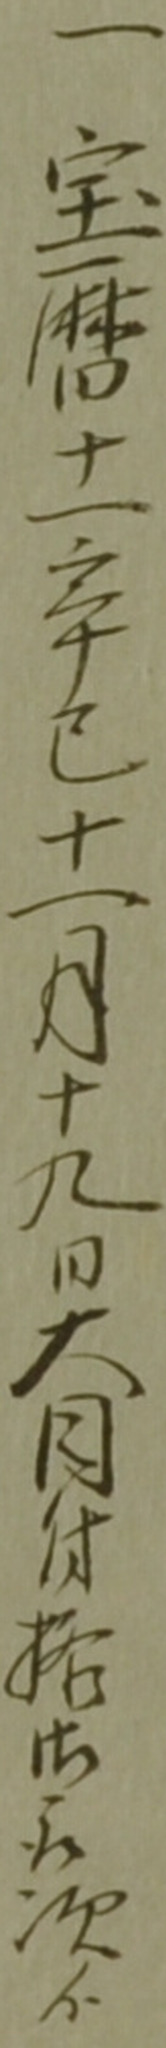一宝暦十一辛巳十一月十九日大目付格御取次ゟ
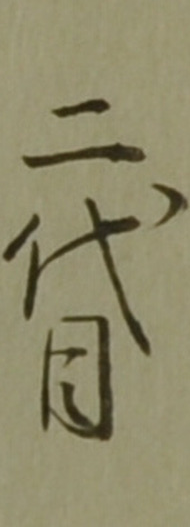二代目
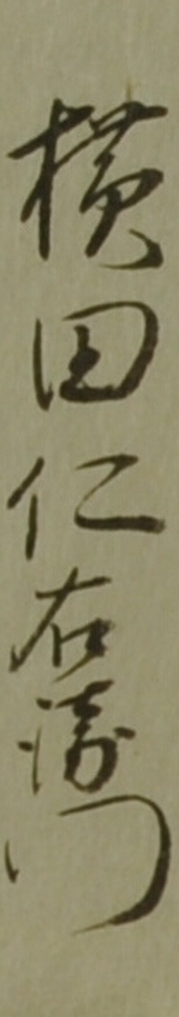横田仁右衛門
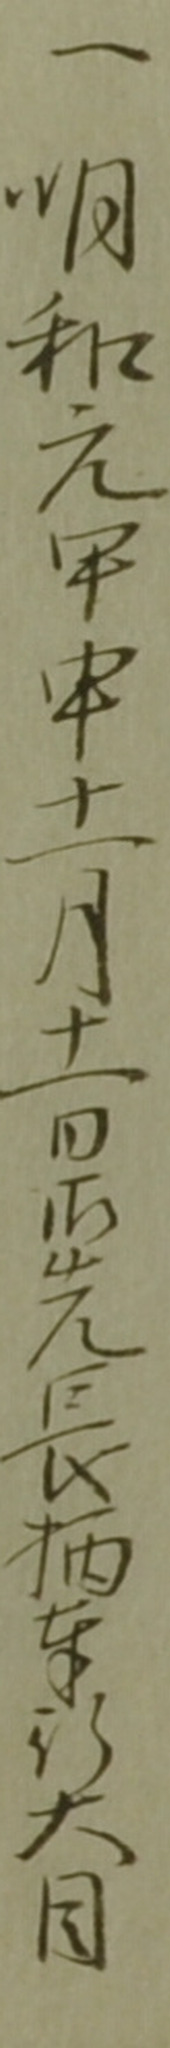一明和元甲申十一月十一日御先長柄奉行大目
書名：諸御役代々録（七）
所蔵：伊那市立高遠町図書館・合同会社AMANE
